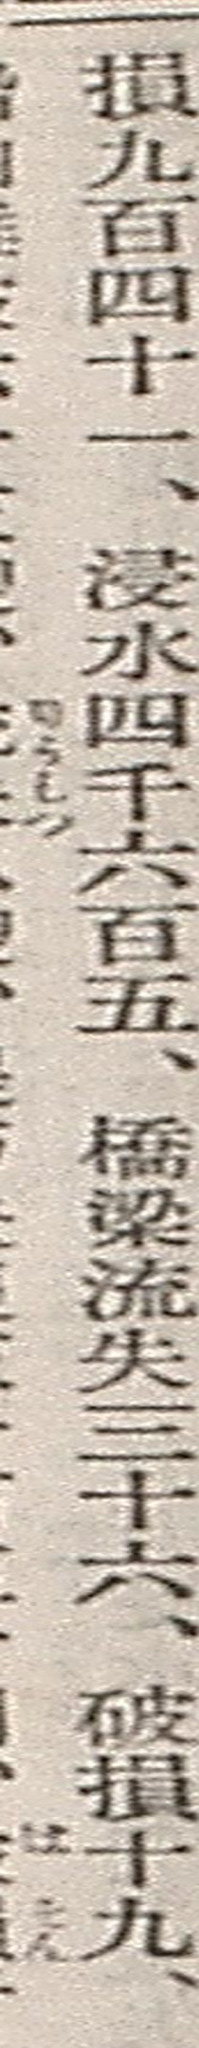損九百四十一、浸水四千六百五、橋梁流失三十六、破損十九、
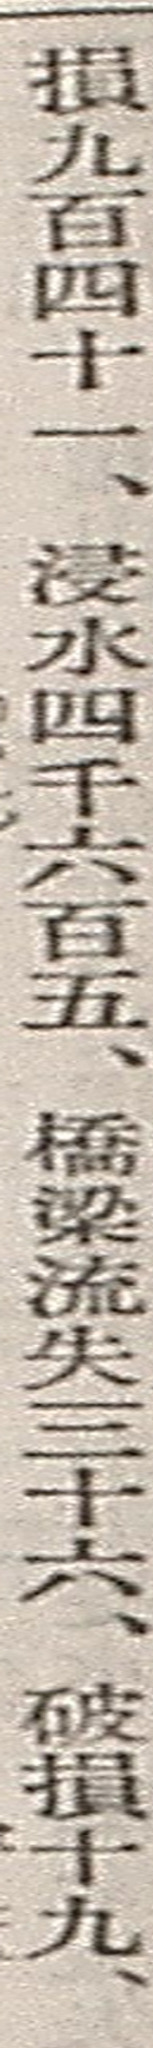損九百四十一、浸水四千六百五、橋梁流失三十六、破損十九、
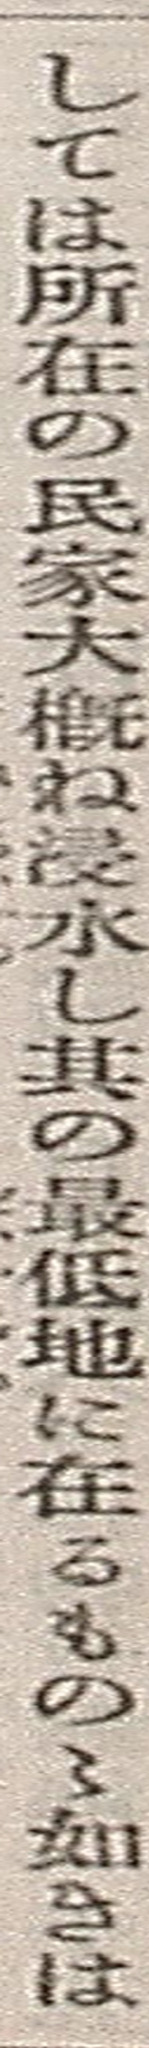しては所在の民家大概ね浸水し其の最低地に在るものゝ如きは
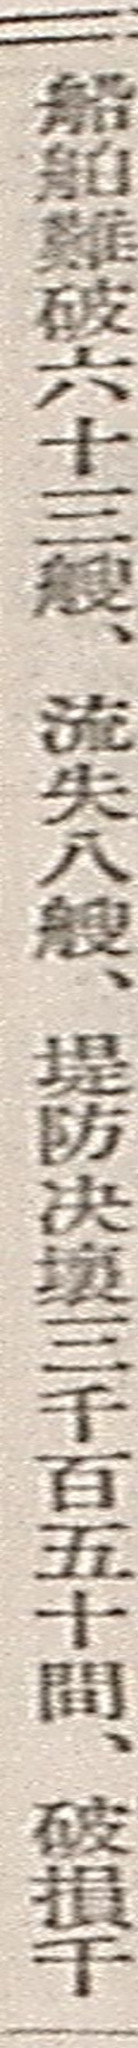船舶難破六十三艘、流失八艘、堤防決壊三千百五十間、破損千
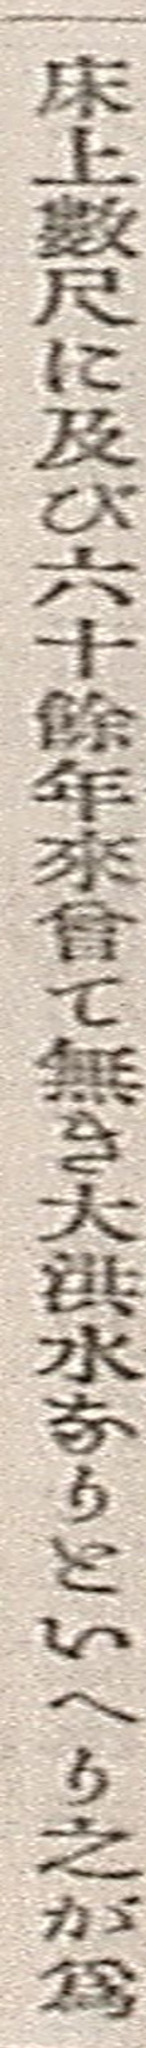床上数尺に及び六十餘年来曾て無き大洪水なりといへり之が為
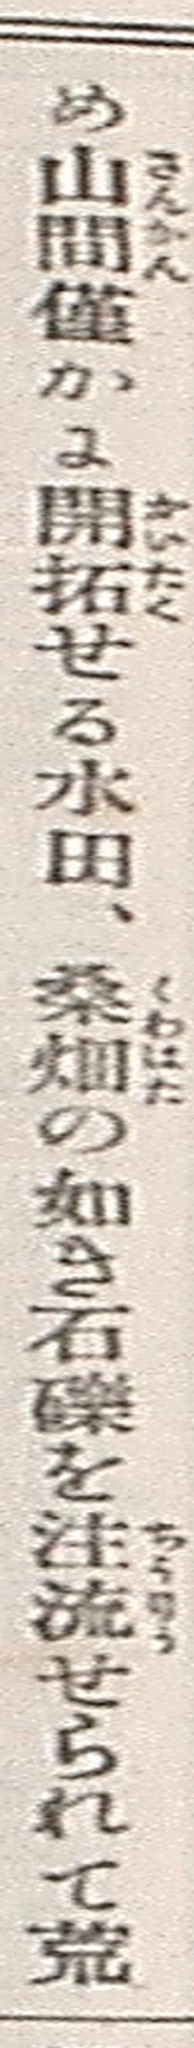め山間僅かに開拓せる水田、桑畑の如き石礫を注流せられて荒
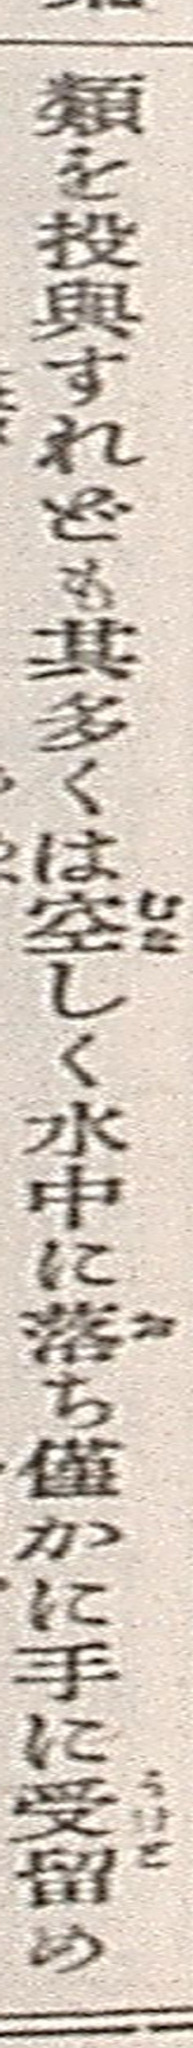類を投輿すれども其多くは空しく水中に落ち僅かに手に受留め
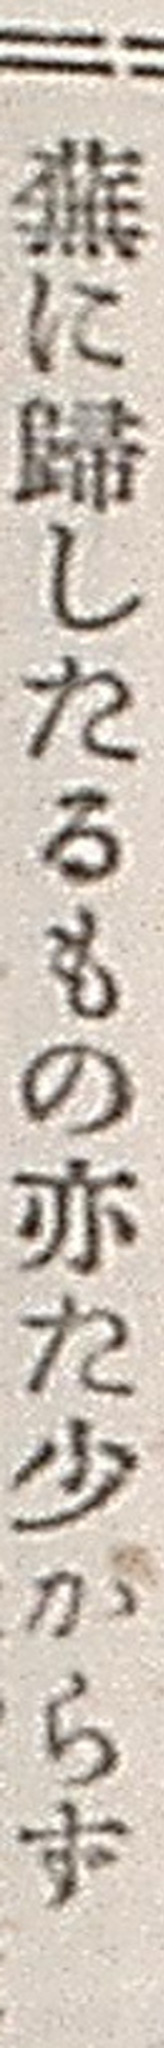蕪に帰したるもの亦少からず
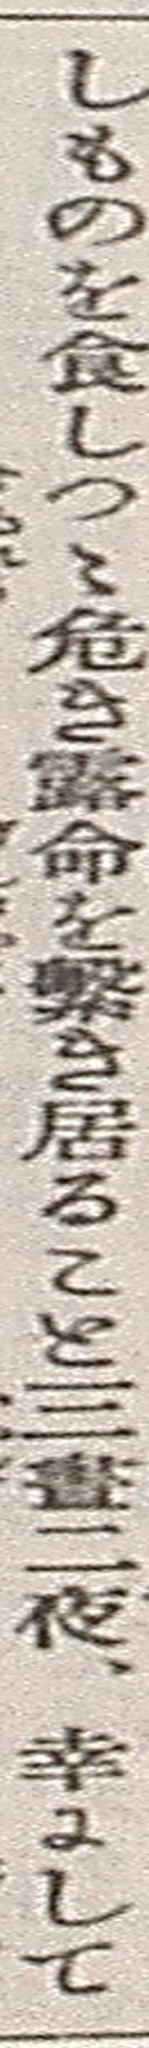しものを食しつゝ危き露命を繋ぎ居ること三晝二夜、幸にして
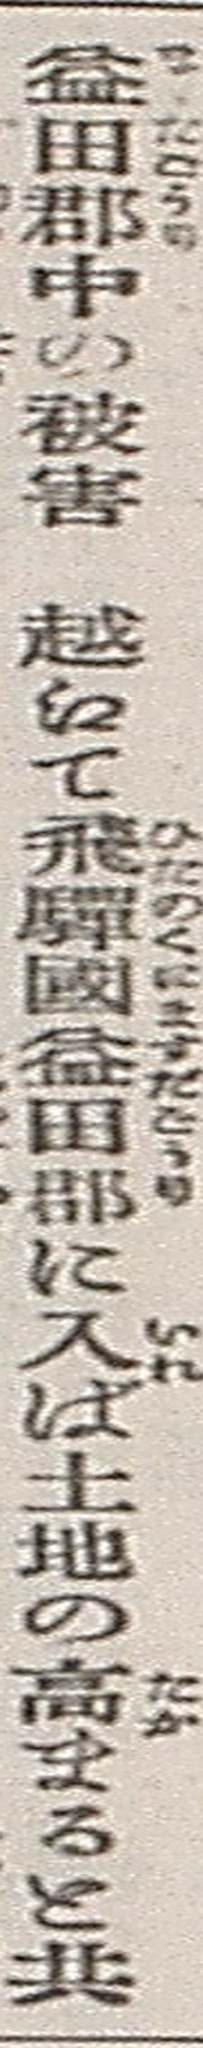益田郡中の被害越えて飛騨国益田郡に入ば土地の高まると共
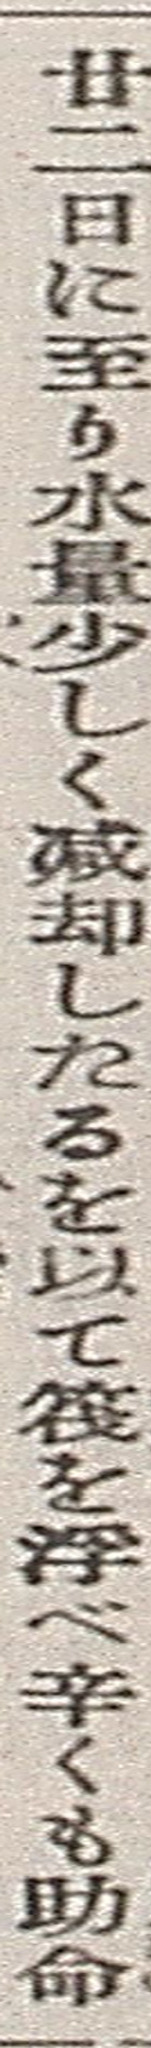廿二日に至り水量少しく減却したるを以て筏を浮べ辛くも助命
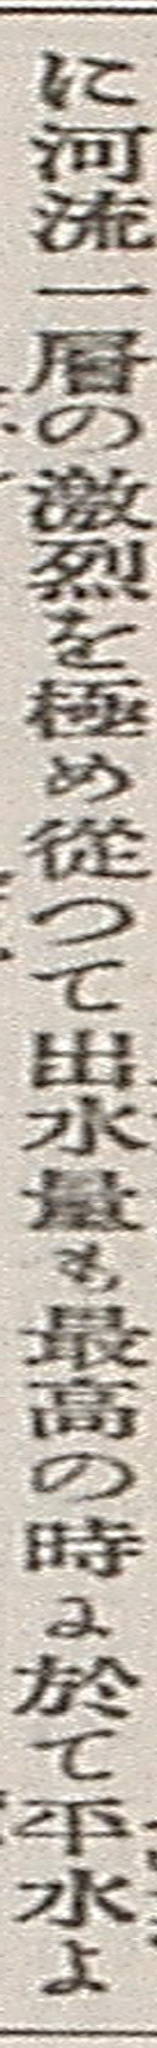に河流一層の激烈を極め従って出水量も最高の時に於て平水よ
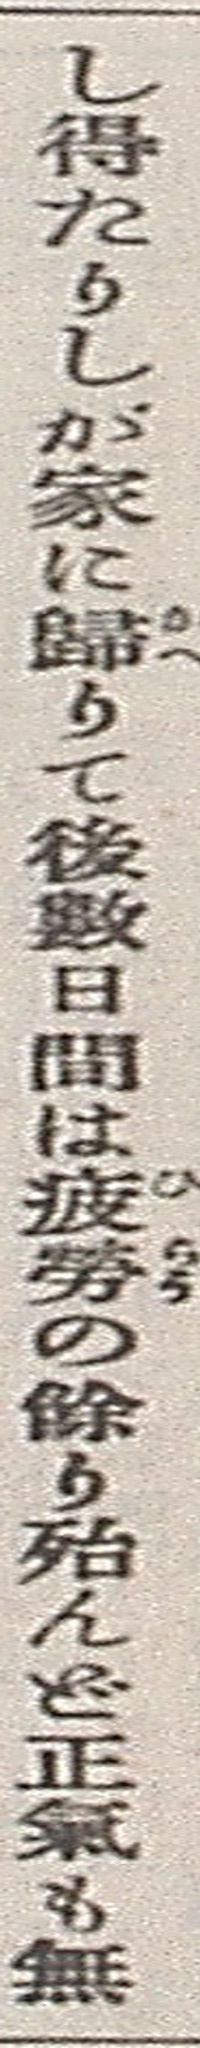し得たりしが家に帰りて後数日間は疲労の餘り殆んど正気も無
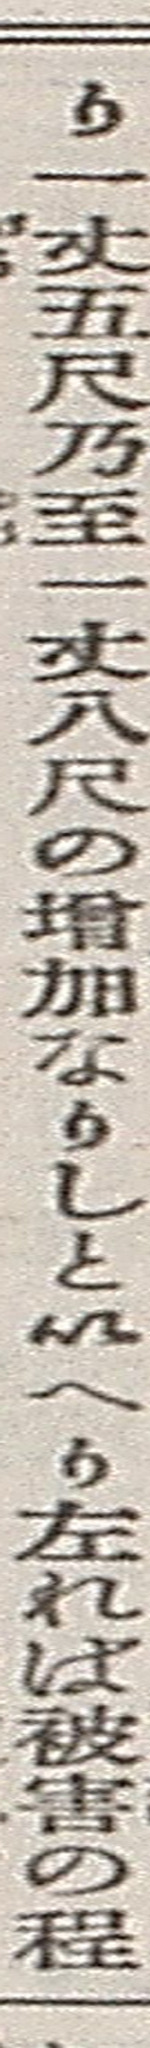り一丈五尺乃至一丈八尺の増加なりしといへり左れば被害の程
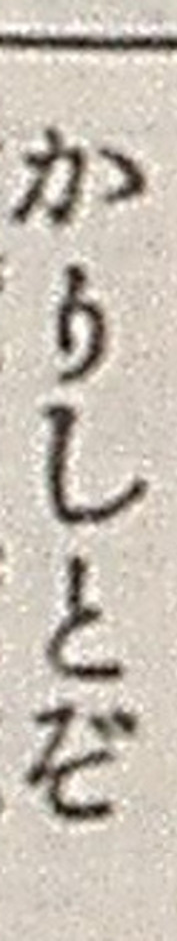かりしとぞ
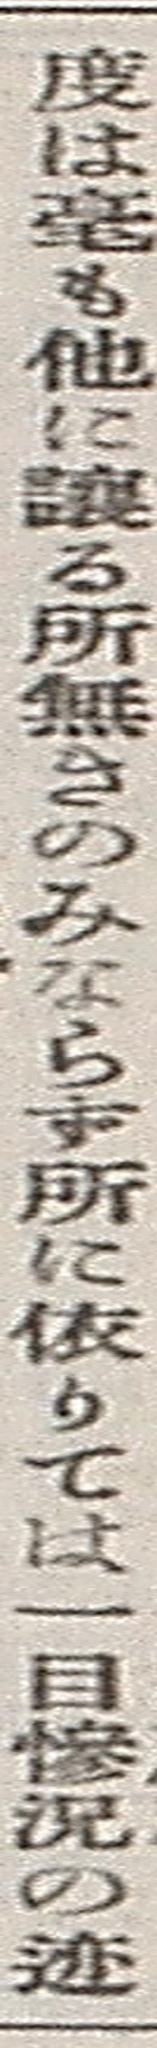度は毫も他に譲る所無きのみならず所に依りては一目惨況の迹
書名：風俗畫報臨時増刊第百二十八號　洪水被害録（下）
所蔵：東京大学地震研究所図書室 Earthquake Research Institute Library, The University of Tokyo, JAPAN
